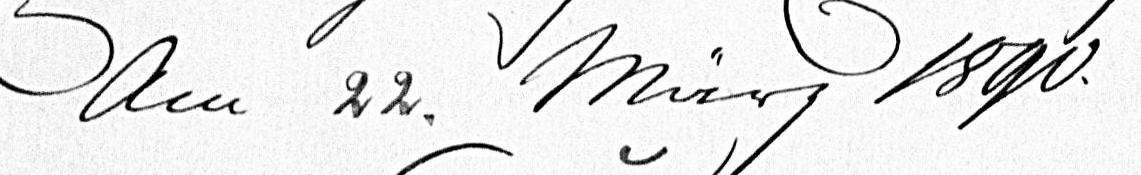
Am 22. März 1890.
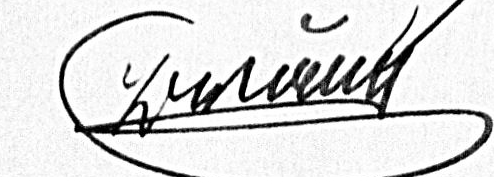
Braun
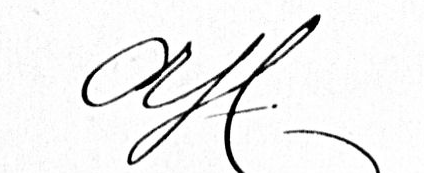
Ahx.
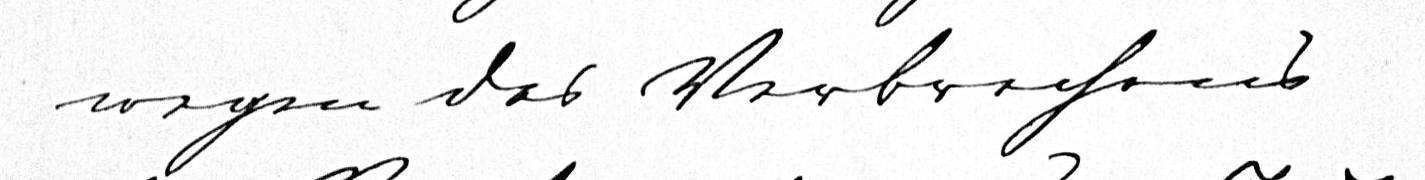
wegen des Verbrechens
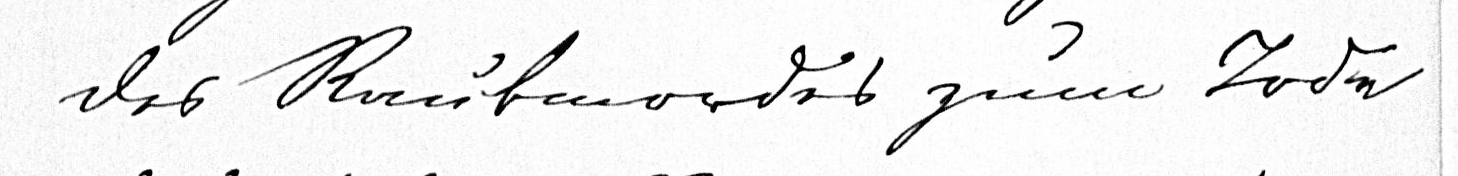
des Raubmordes zum Tode
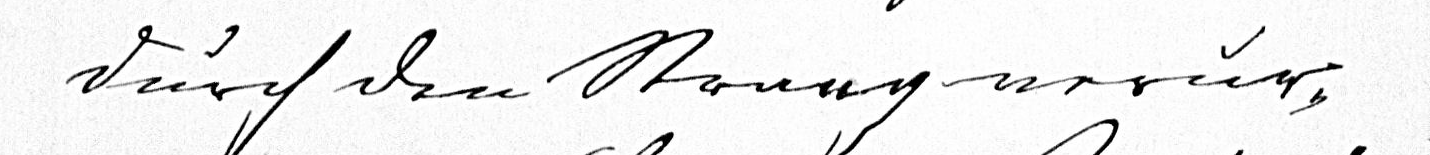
durch den Strang verur¬
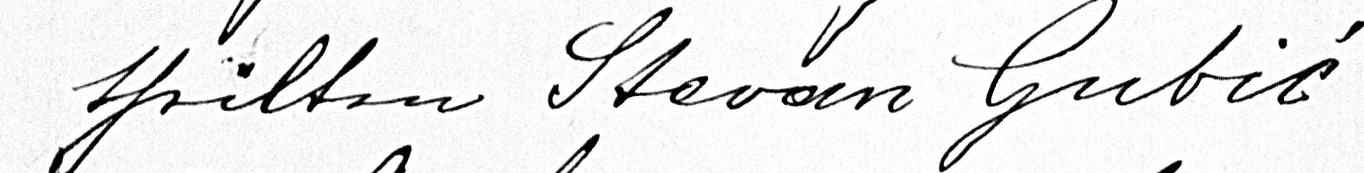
theilten Stevan Gubić
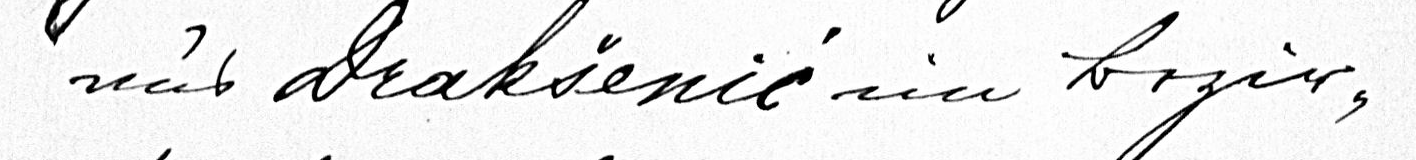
aus Drakšenić im Bezir
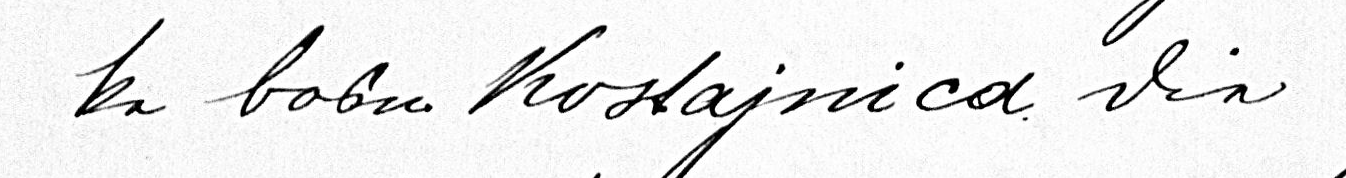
ke bosn. Kostajnica die
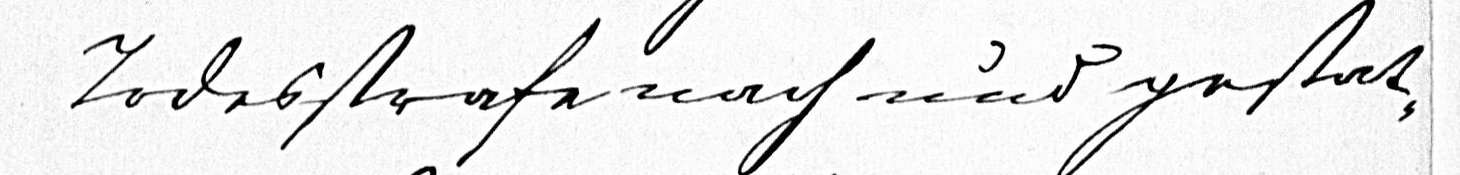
Todesstrafe nach und gestat
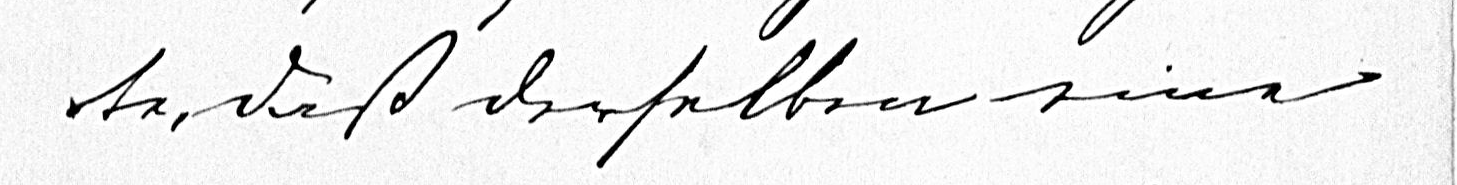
te, daß derselben eine
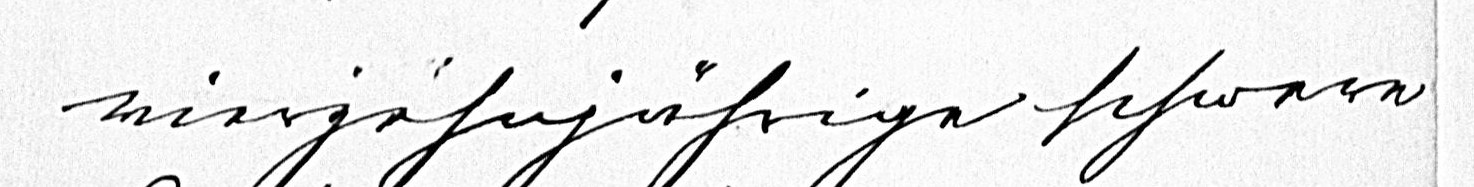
vierzehnjährige schwere
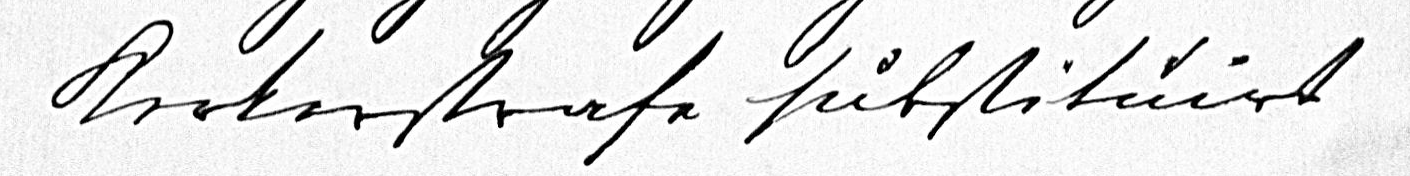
Kerkerstrafe substituirt
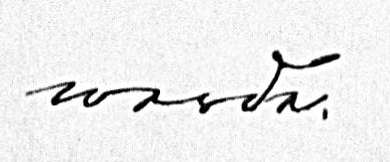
werde.
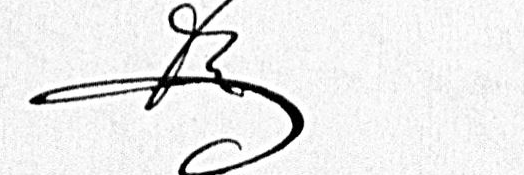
xx
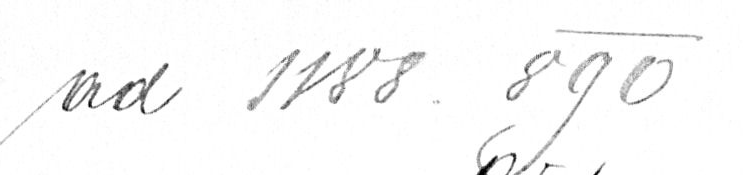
ad 1188.890
